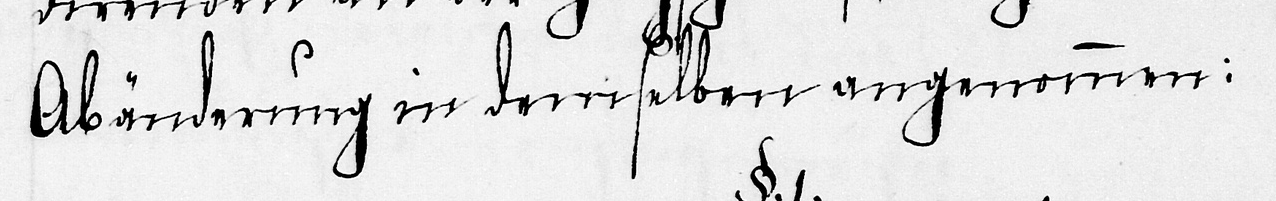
Abänderung in demselben angenommen:
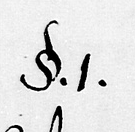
§. 1.
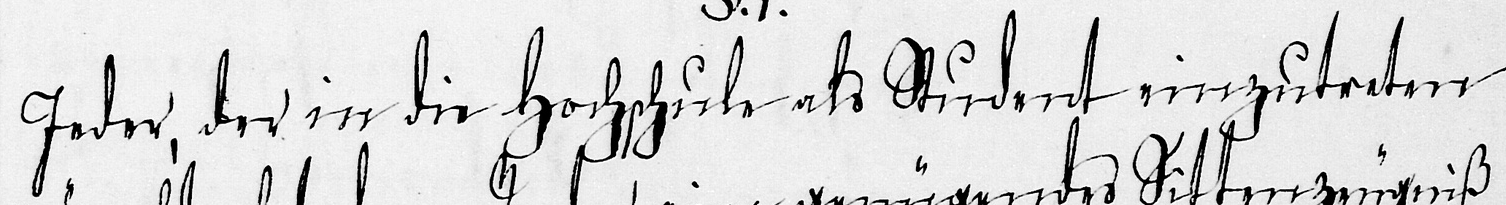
Jeder, der in die Hochschule als Student einzutreten
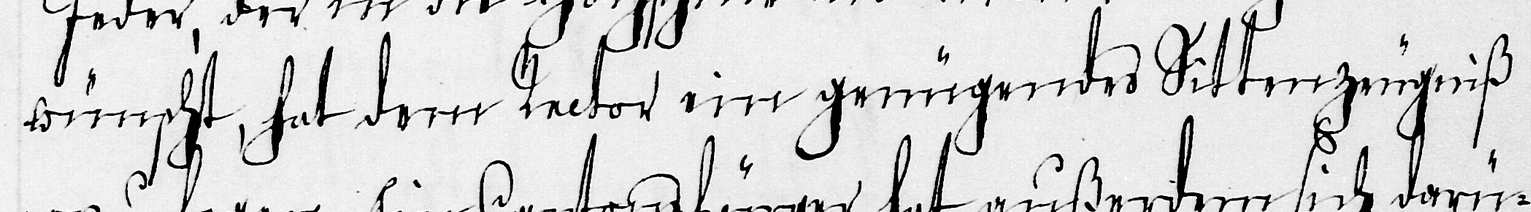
wünscht, hat dem Rector ein genügendes Sittenzeugniß
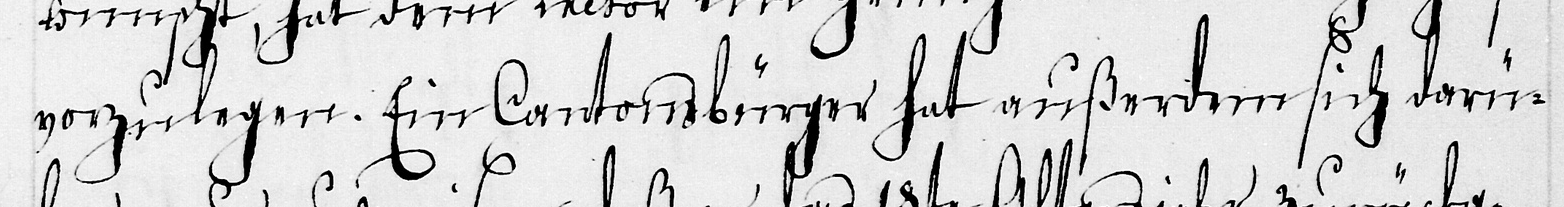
vorzulegen. Ein Cantonsbürger hat außerdem sich darü¬
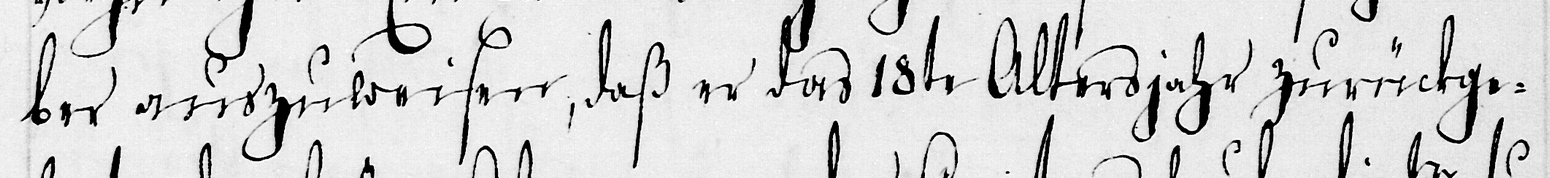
ber auszuweisen, daß er das 18te Altersjahr zurückge¬
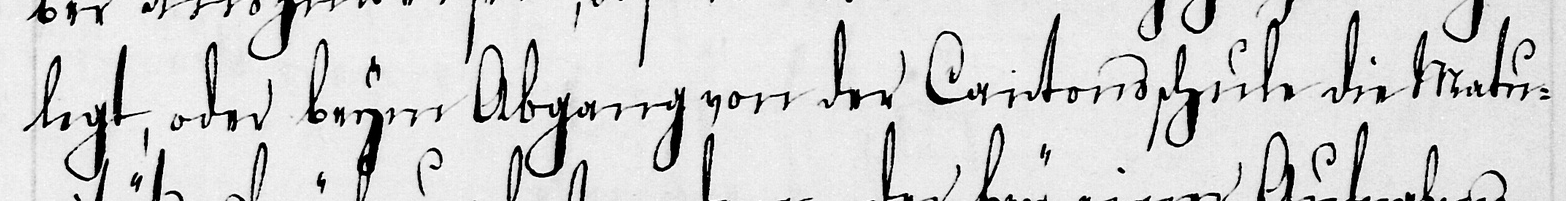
legt, oder beym Abgang von der Cantonsschule die Matu¬
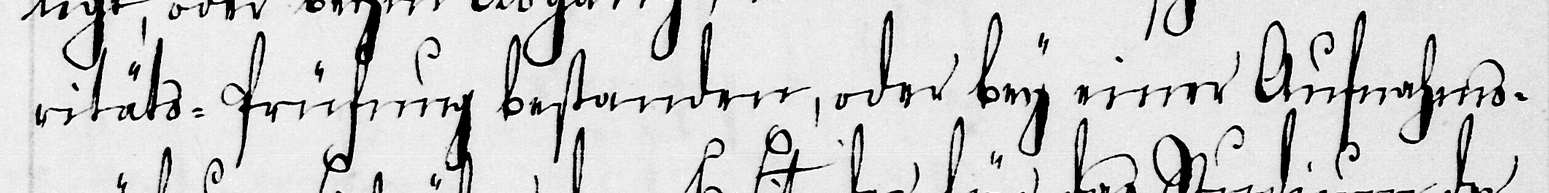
ritäts-Prüfung bestanden, oder bey einer Aufnahms¬
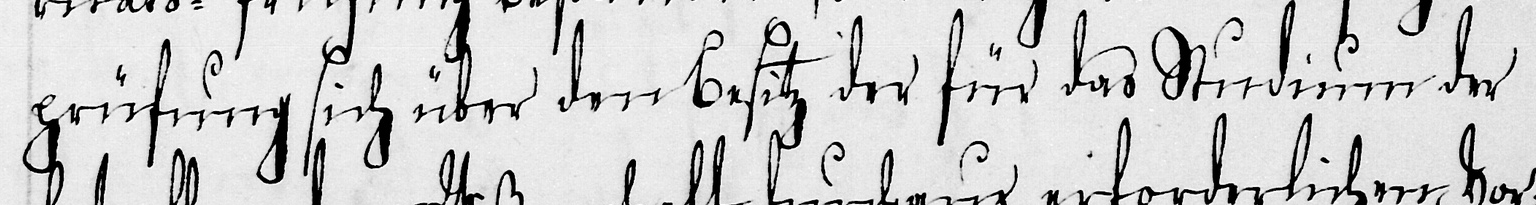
prüfung sich über den Besitz der für das Studium der
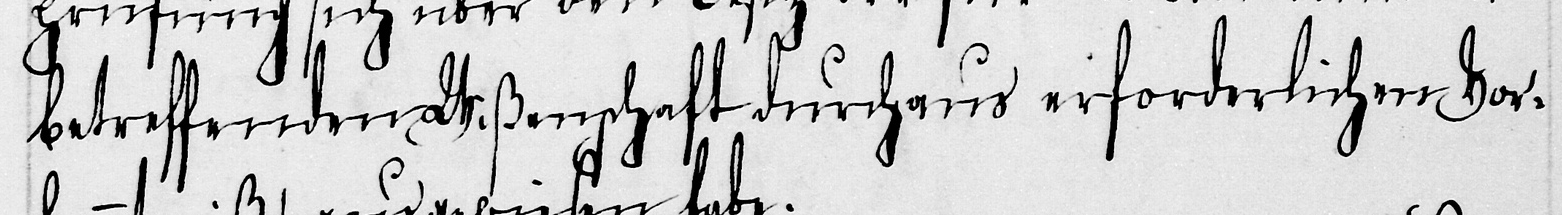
betreffenden Wißenschaft durchaus erforderlichen Vor¬
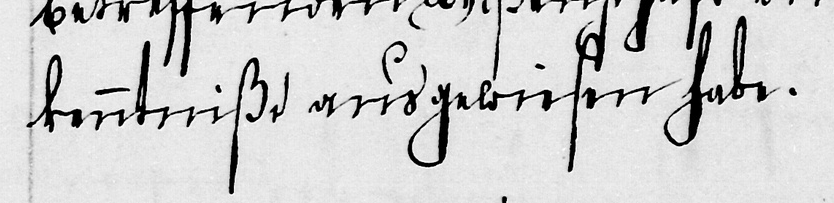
kenntniße ausgeweisen habe.
